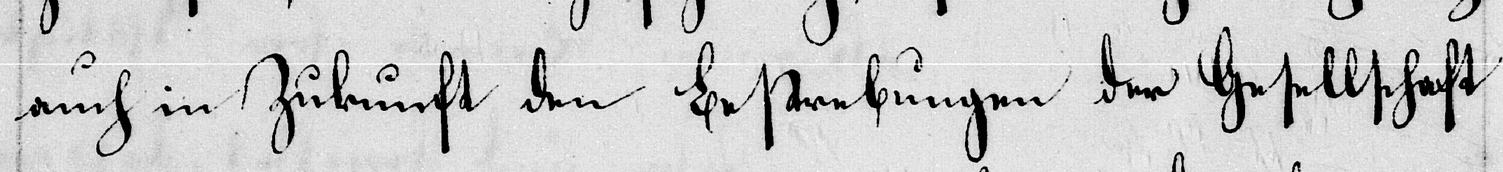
auch in Zukunft den Bestrebungen der Gesellschaft
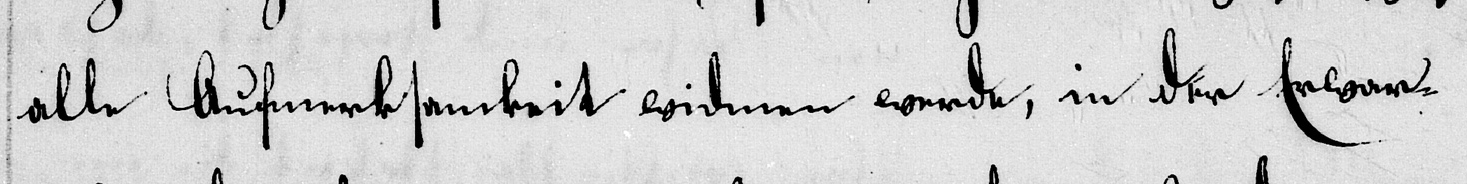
alle Aufmerksamkeit widmen werde, in der Erwar¬
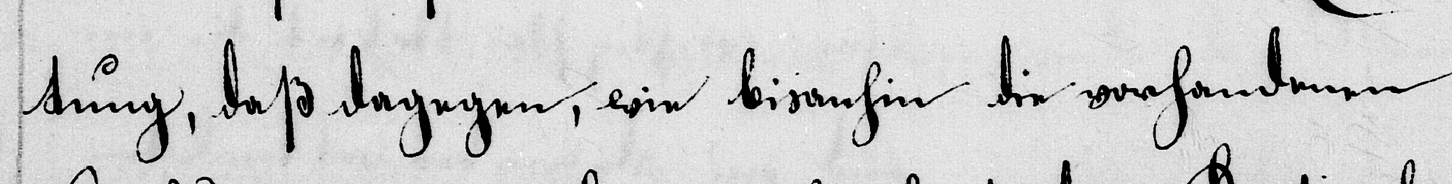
tung, daß dagegen, wie bisanhin die vorhandenen
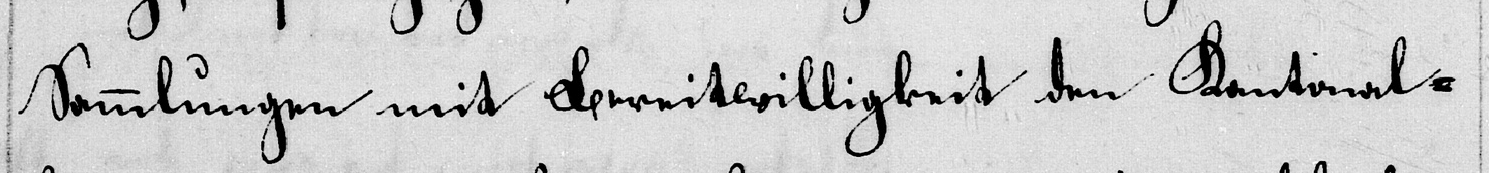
Sammlungen mit Bereitwilligkeit den Kantonal-L¬
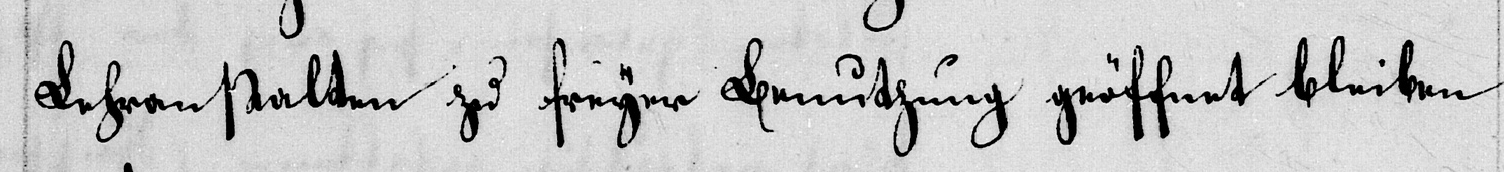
ehranstalten zu freyer Benutzung geöffnet bleiben
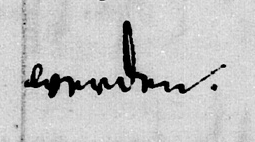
werden.
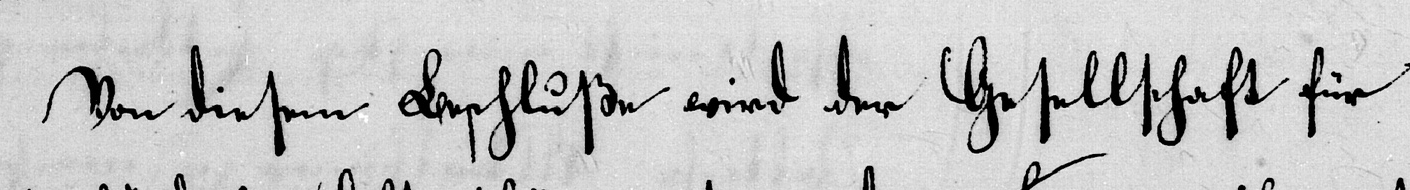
Von diesem Beschluße wird der Gesellschaft für
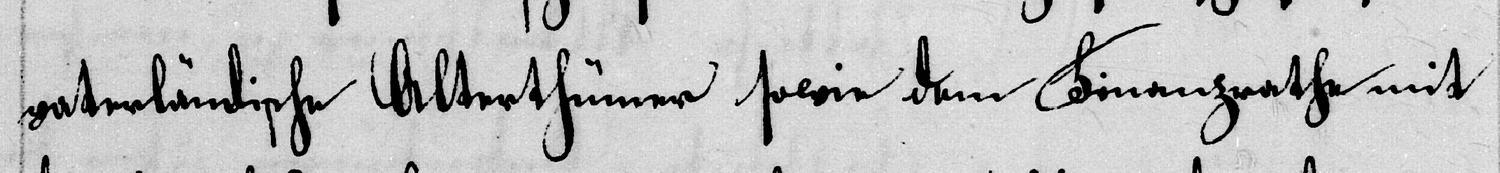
vaterländische Alterthümer sowie dem Finanzrathe mit
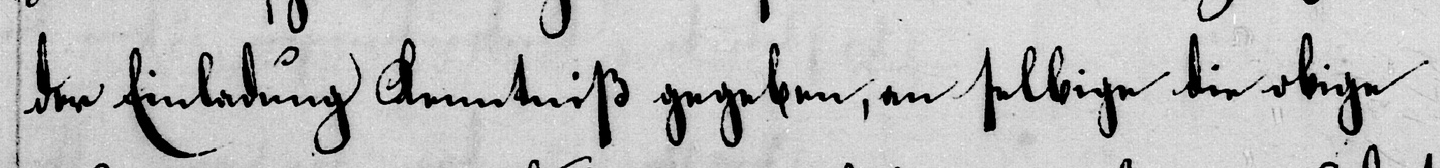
der Einladung Kenntniß gegeben, an selbige die obige
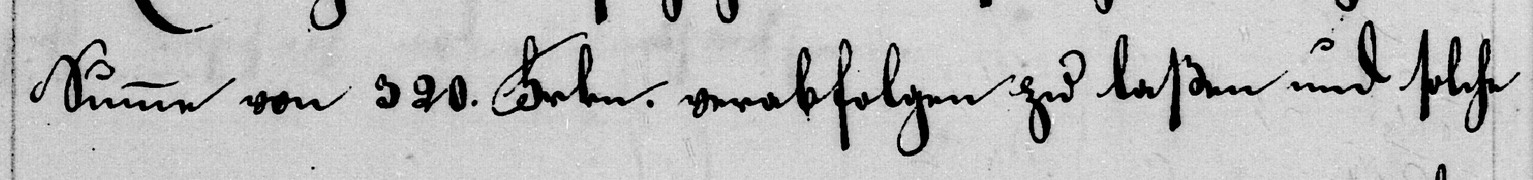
Summe von 320. Frk[en]. verabfolgen zu laßen und solche
